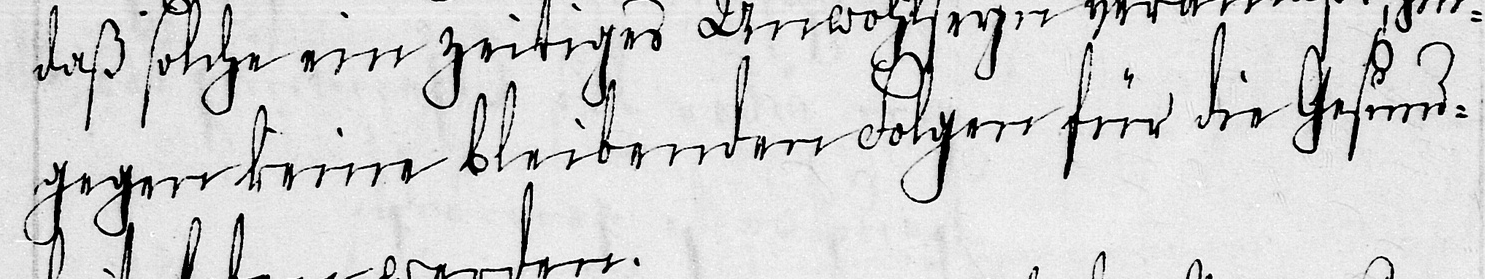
gegen keine bleibenden Folgen für die Gesund¬
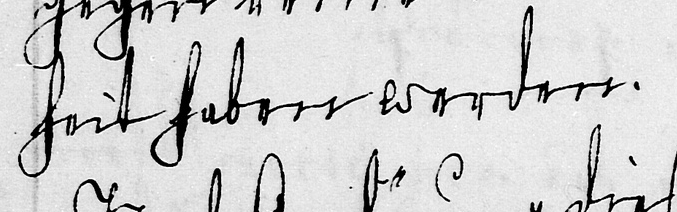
heit haben werden.
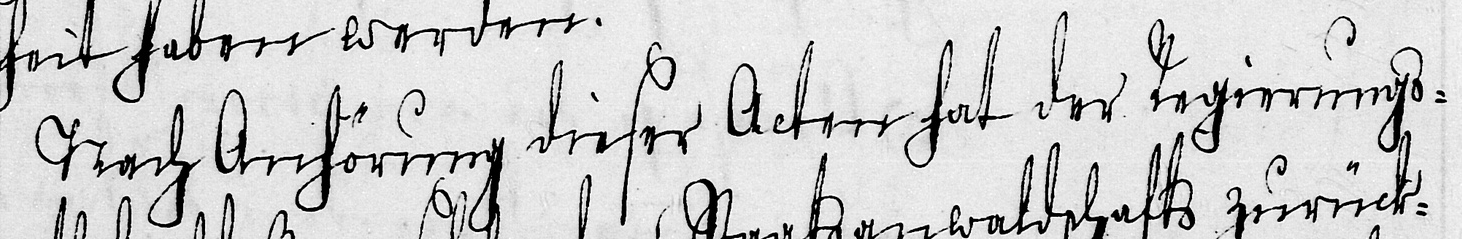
Nach Anhörung dieser Acten hat der Regierungs¬
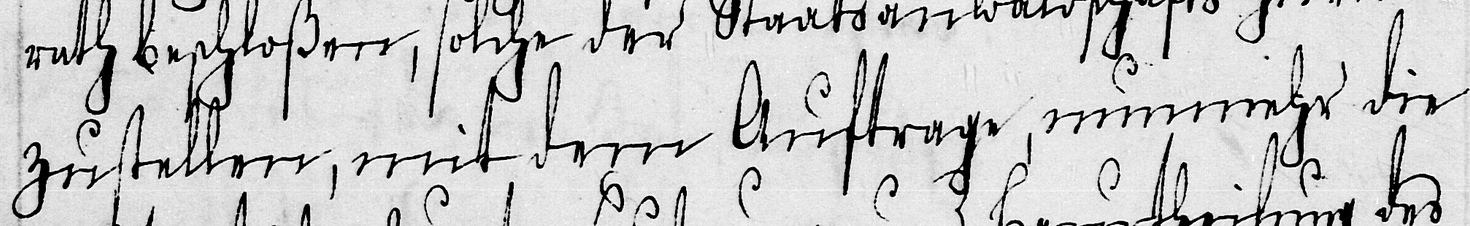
zustellen, mit dem Auftrage, nunmehr die
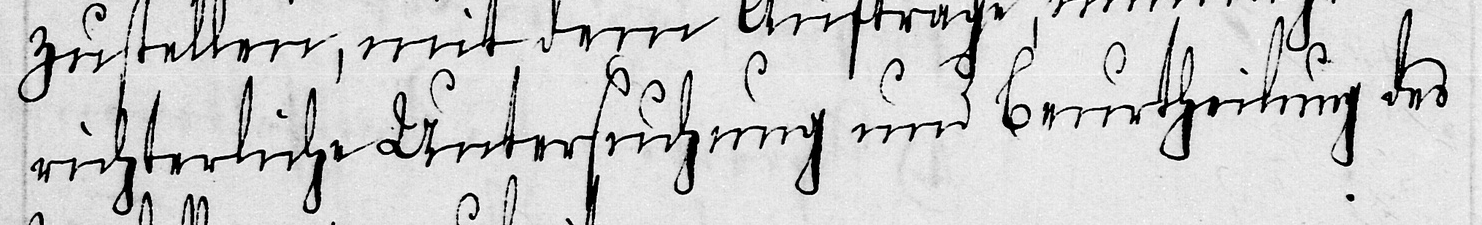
richterliche Untersuchung und Beurtheilung des
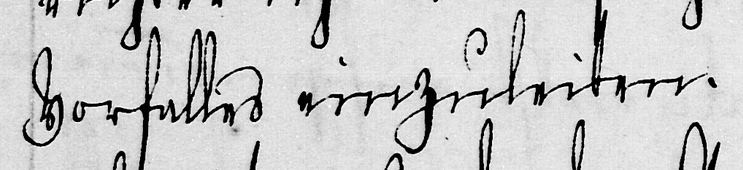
Vorfalles einzuleiten.
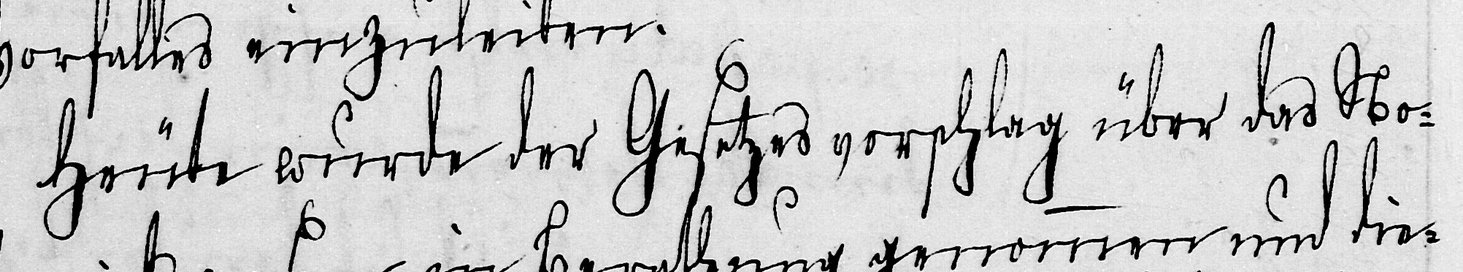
Heute wurde der Gesetzesvorschlag über das No¬
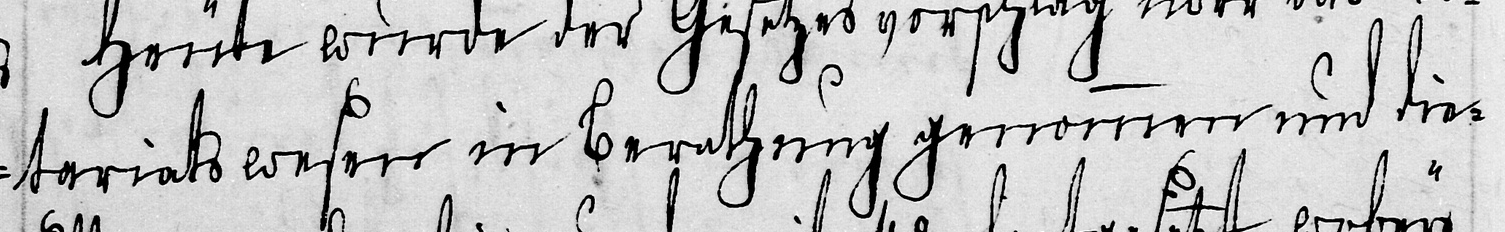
tariatswesen in Berathung genommen und die¬
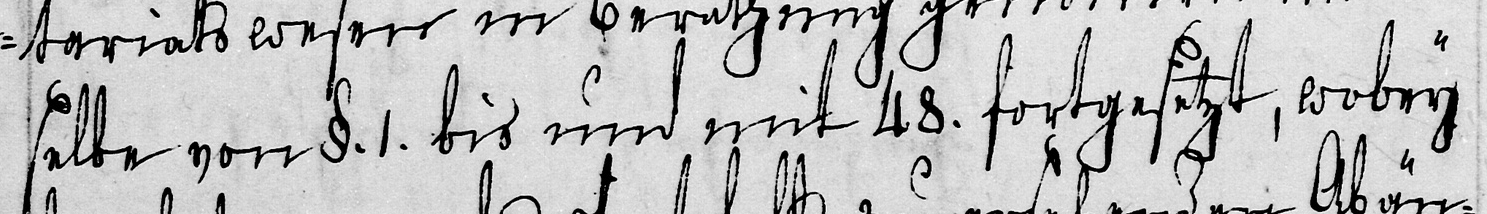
selbe von §. 1. bis und mit 48. fortgesetzt, wobey
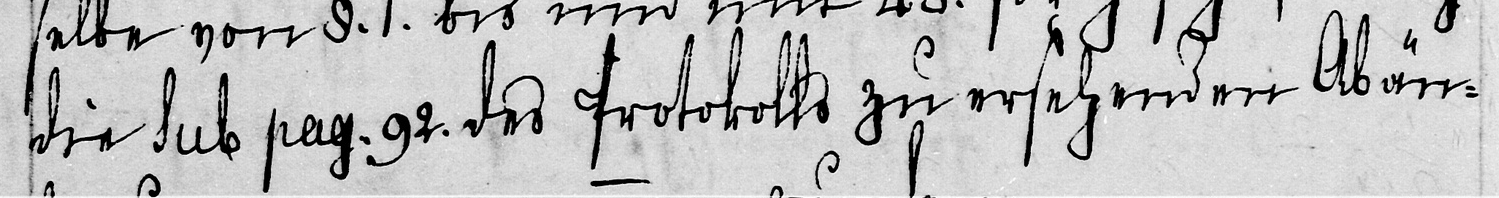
die Sub pag. 92. des Protokolls zu ersehenden Abän¬
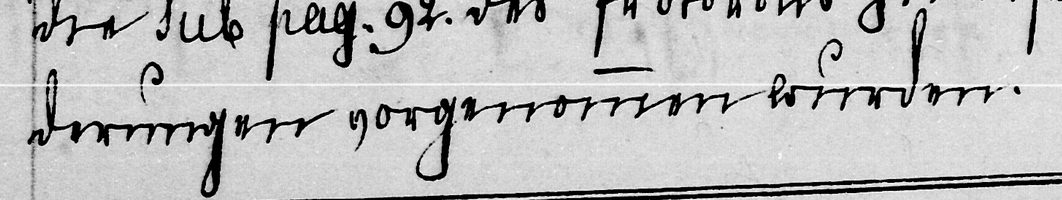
derungen vorgenommen wurden.
